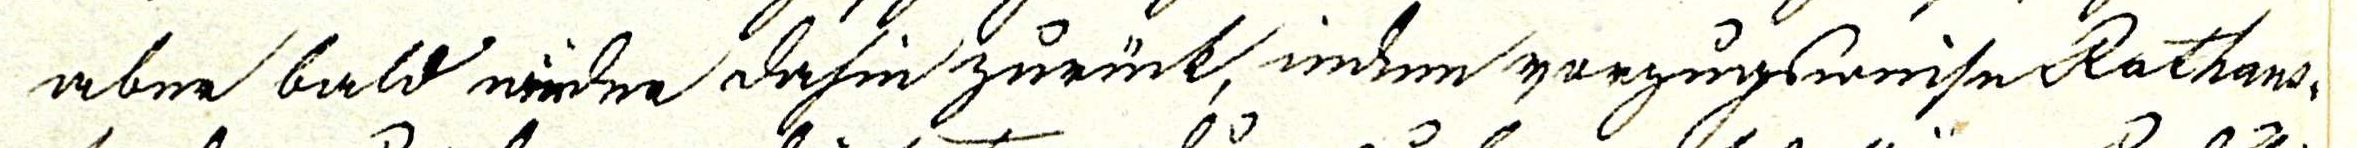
aber bald wider dahin zurück, indem vorzugsweise Rathaus¬
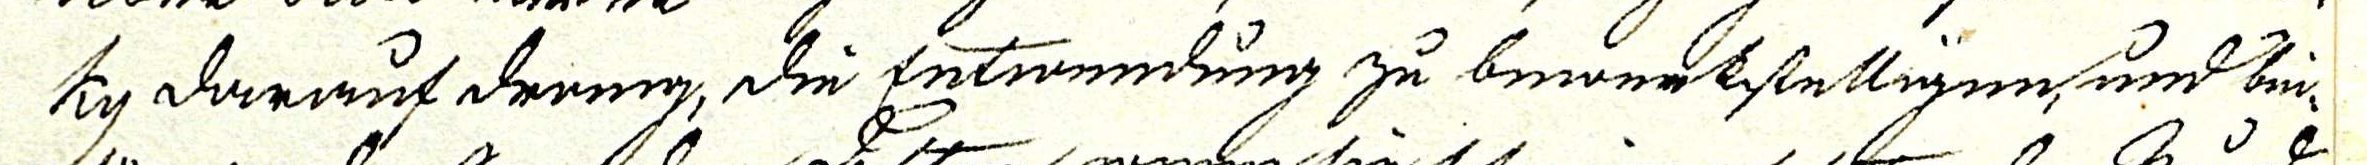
ky darauf drang, die Entwendung zu bewerkstelligen, und bei¬
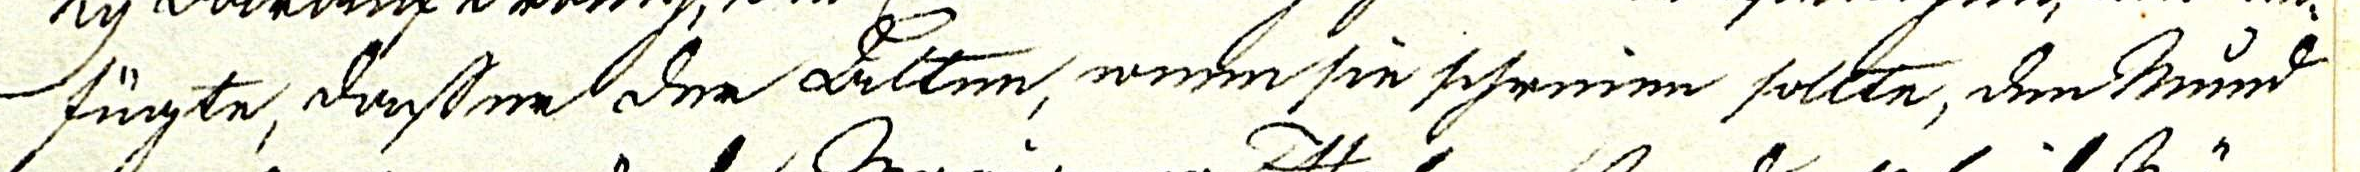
fügte, daß er der Alten, wenn sie schreien sollte, den Mund
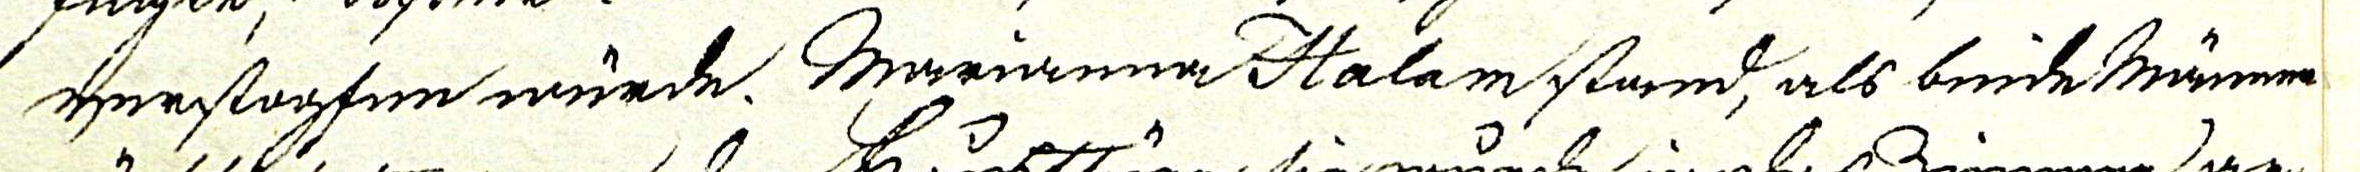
verstopfen würde. Marianna Halam stand, als beide Männer
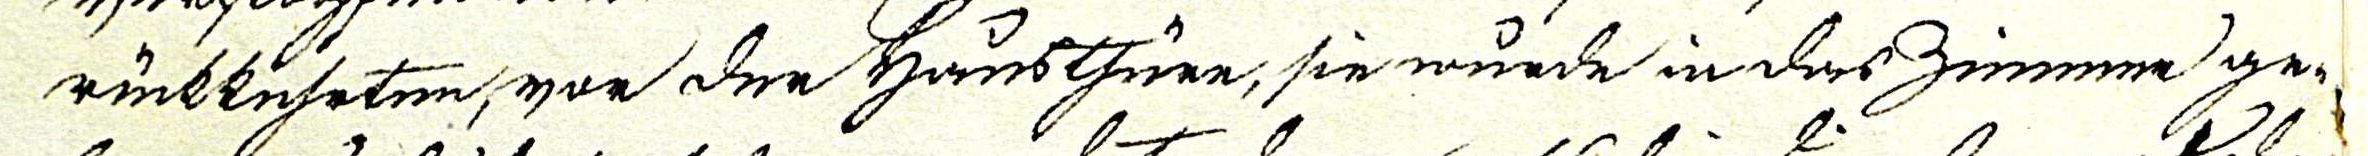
rückkehrten, vor der Hausthüre, sie wurde in das Zimmer ge¬
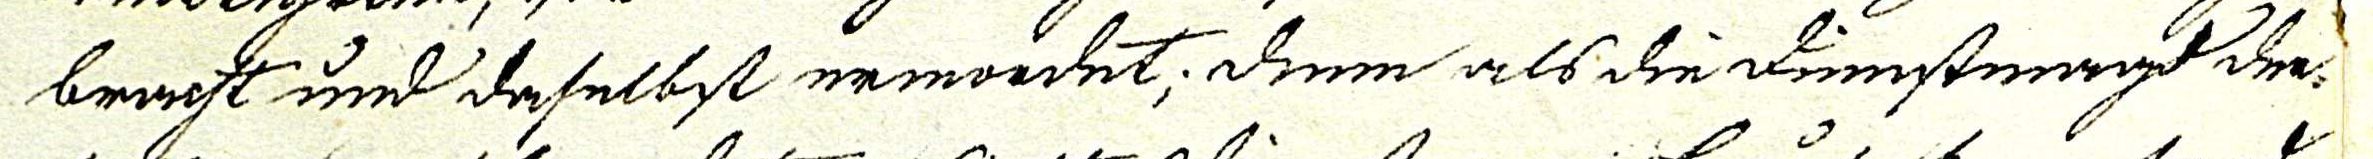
bracht und daselbst ermordet; denn als die Dienstmagd der¬
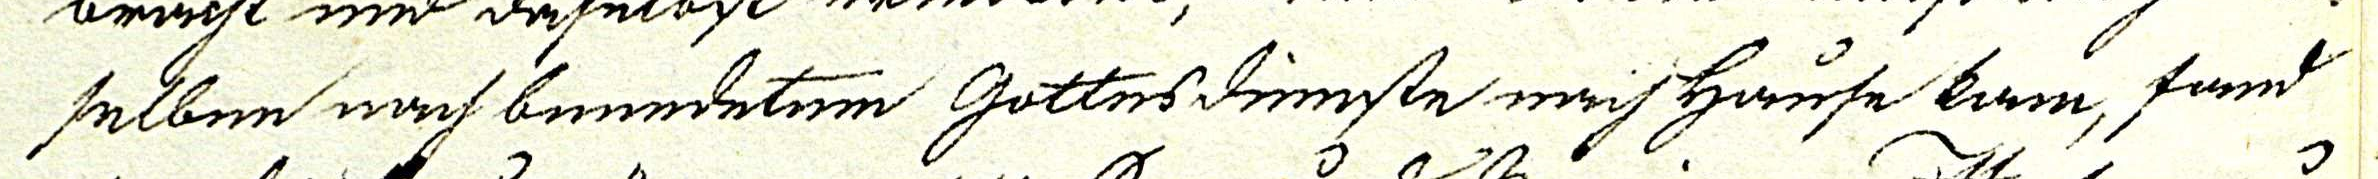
selben nach beendetem Gottesdienste nach Hause kam, fand
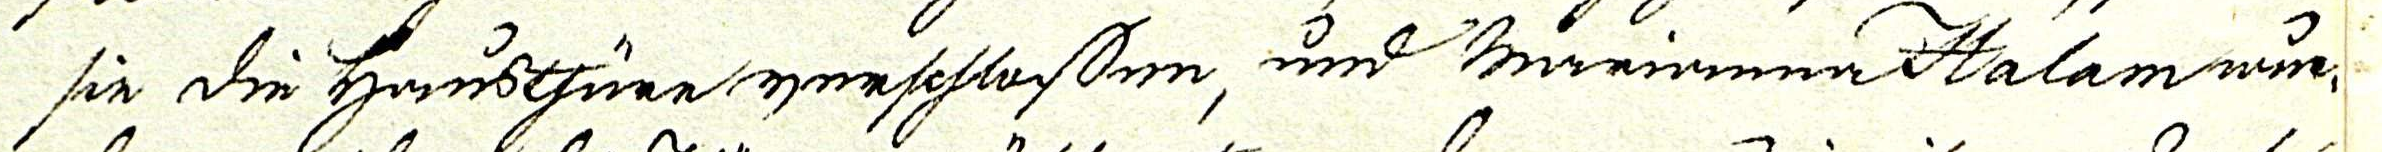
sie die Hausthüre verschloßen, und Marianna Halam wur¬
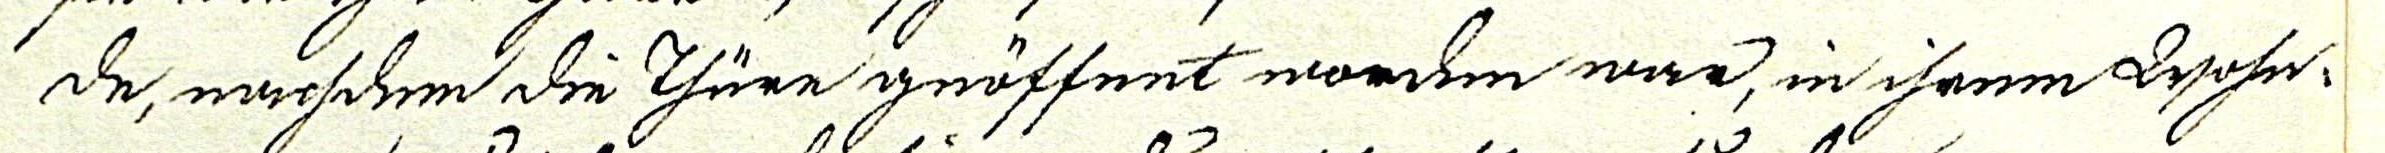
de, nachdem die Thüre geöffnet worden war, in ihrem Wohn¬
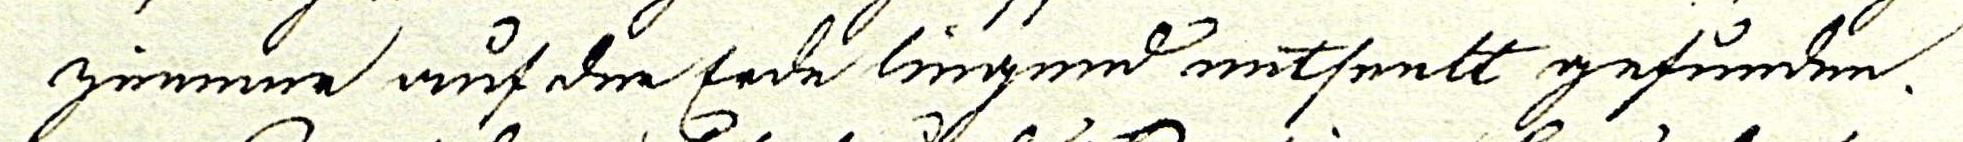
zimmer auf der Erde liegend entseelt gefunden.
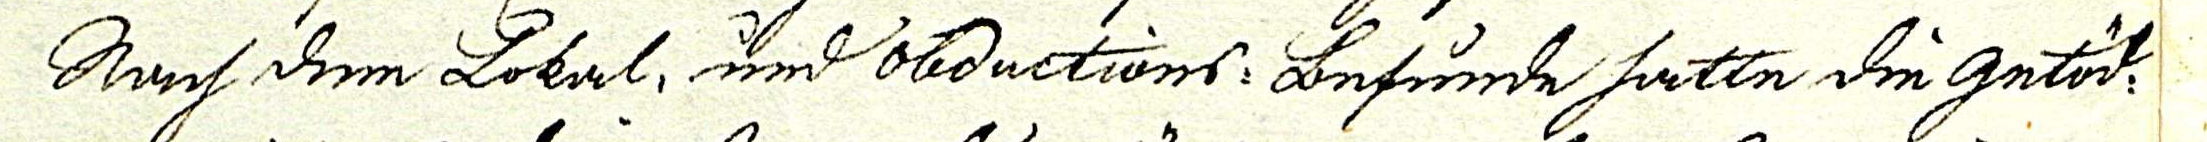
Nach dem Lokal, und Obductions-Befunde hatte die Getöd¬
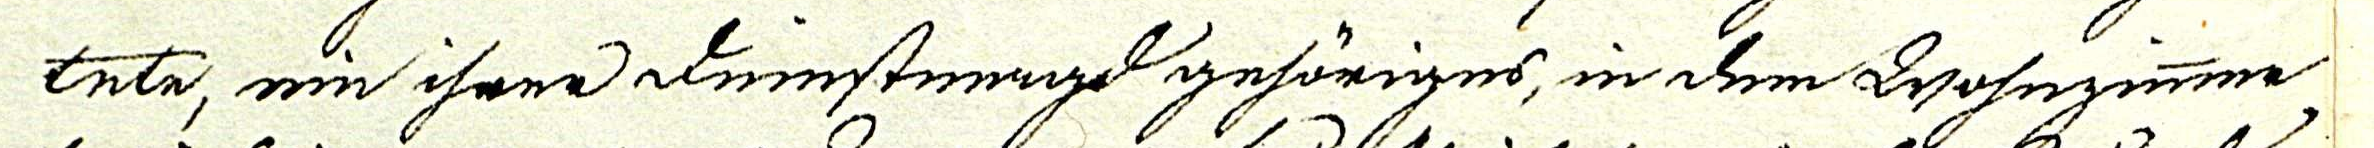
tete, ein ihrer Dienstmagd gehöriges, in dem Wohnzimmer
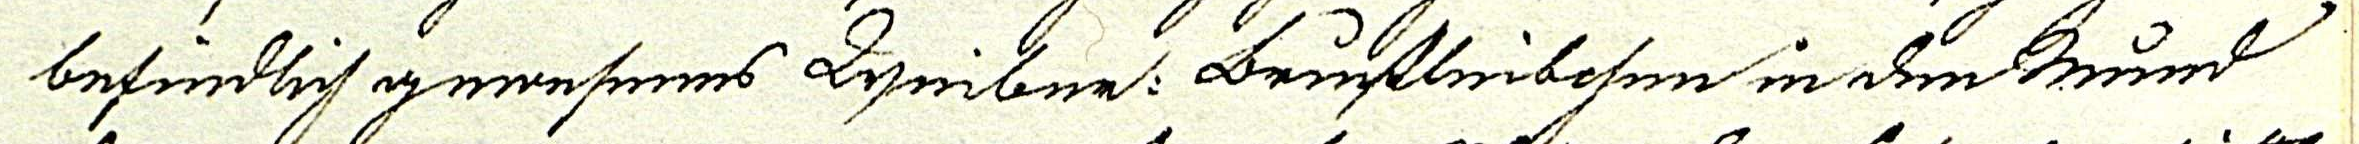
befindlich gewesenes Weiber:Brustleibchen in den Mund
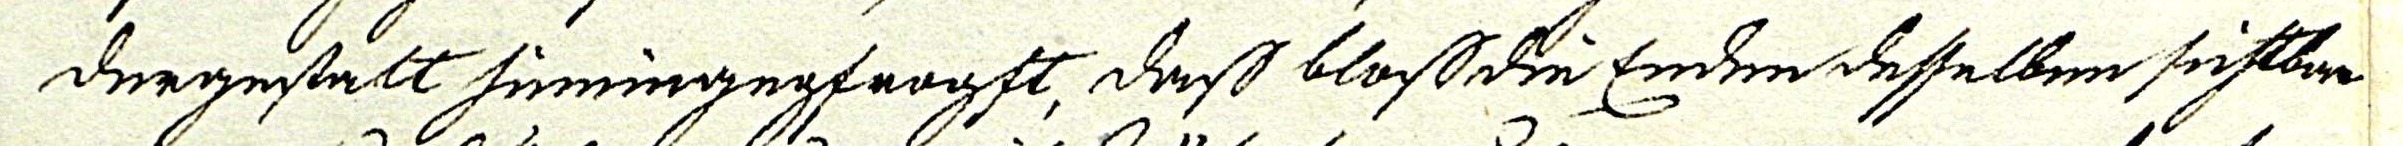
dergestalt hineingepfropft, daß bloß die Enden dasselben sichtbar
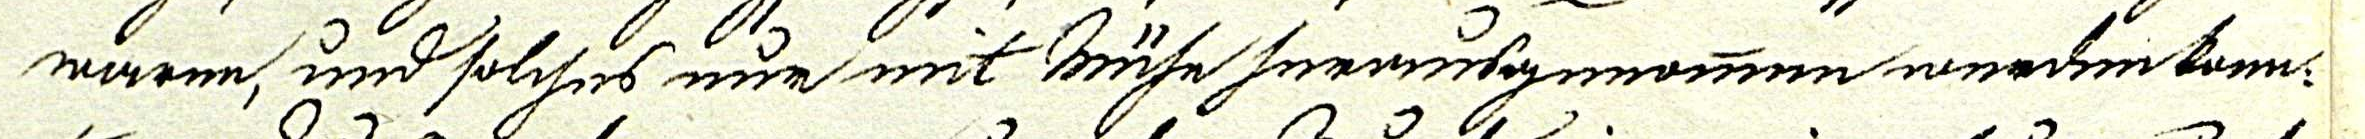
waren, und solches nur mit Mühe herausgenommen werden konn¬
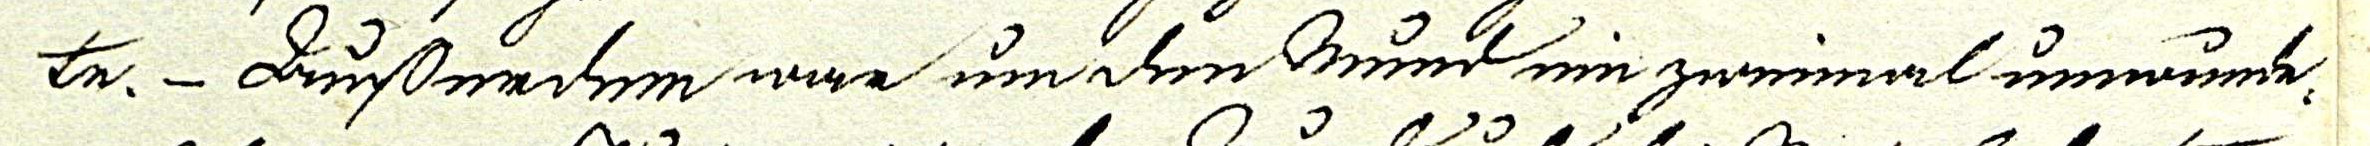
te. Außerdem war um den Mund ein zweimal umwunde¬
